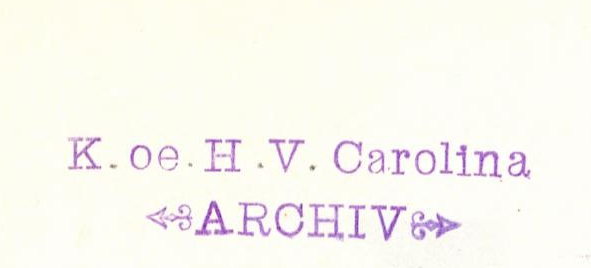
K. oe. H. V. Carolina
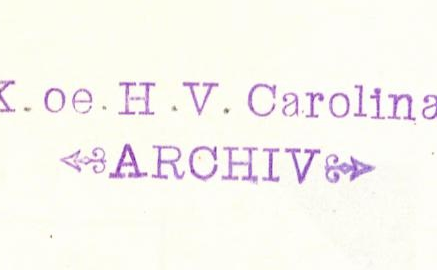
Archiv
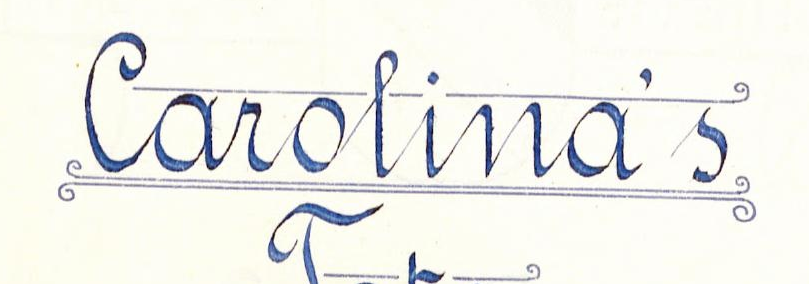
Carolina’s
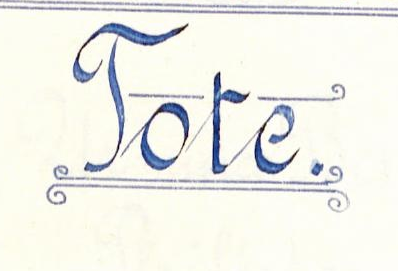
Tote
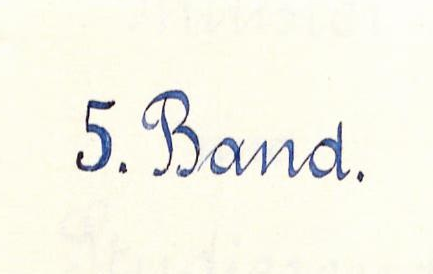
5. Band
